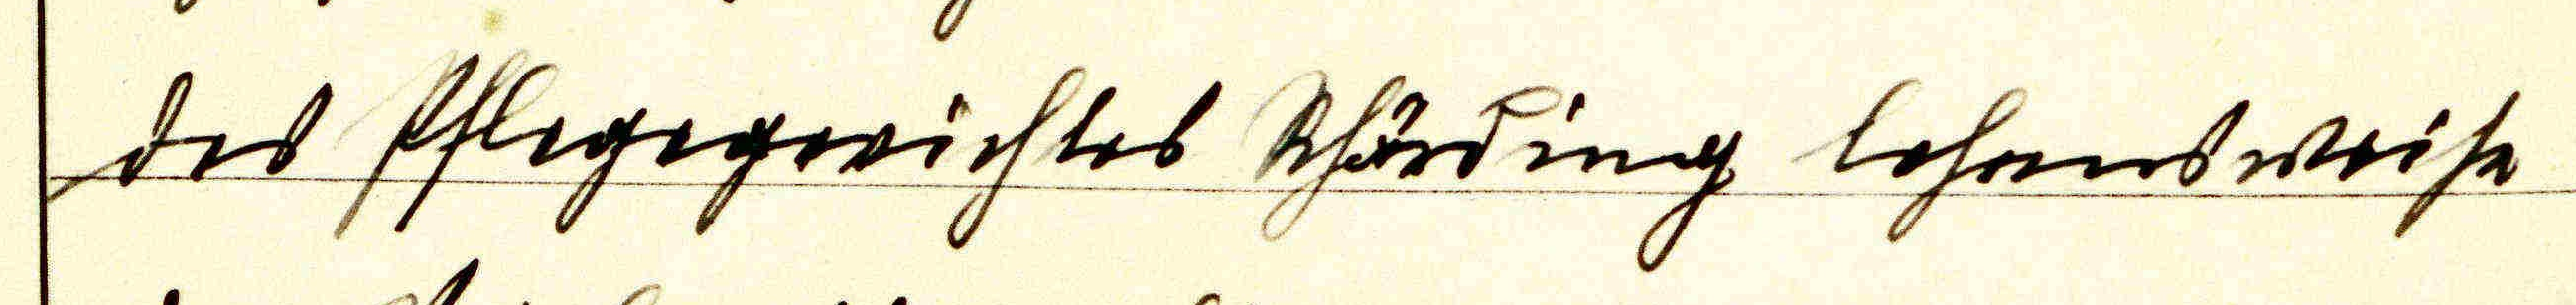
des Pfleggerichtes Schärding lehensweise
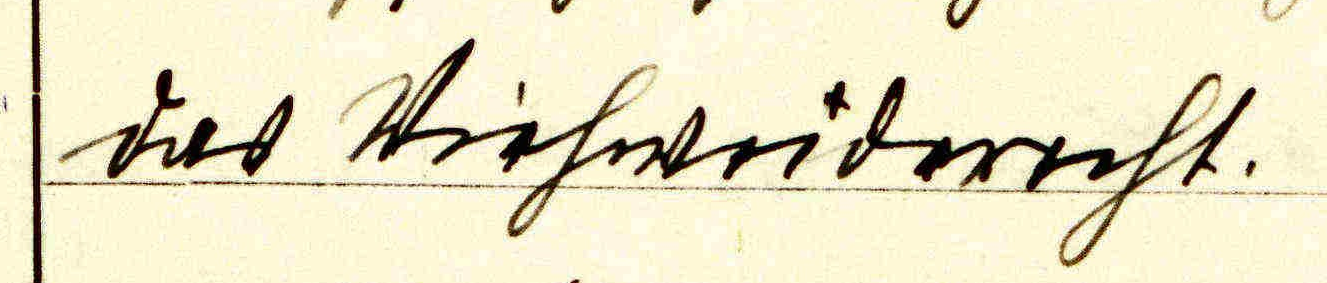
das Viehweiderecht.
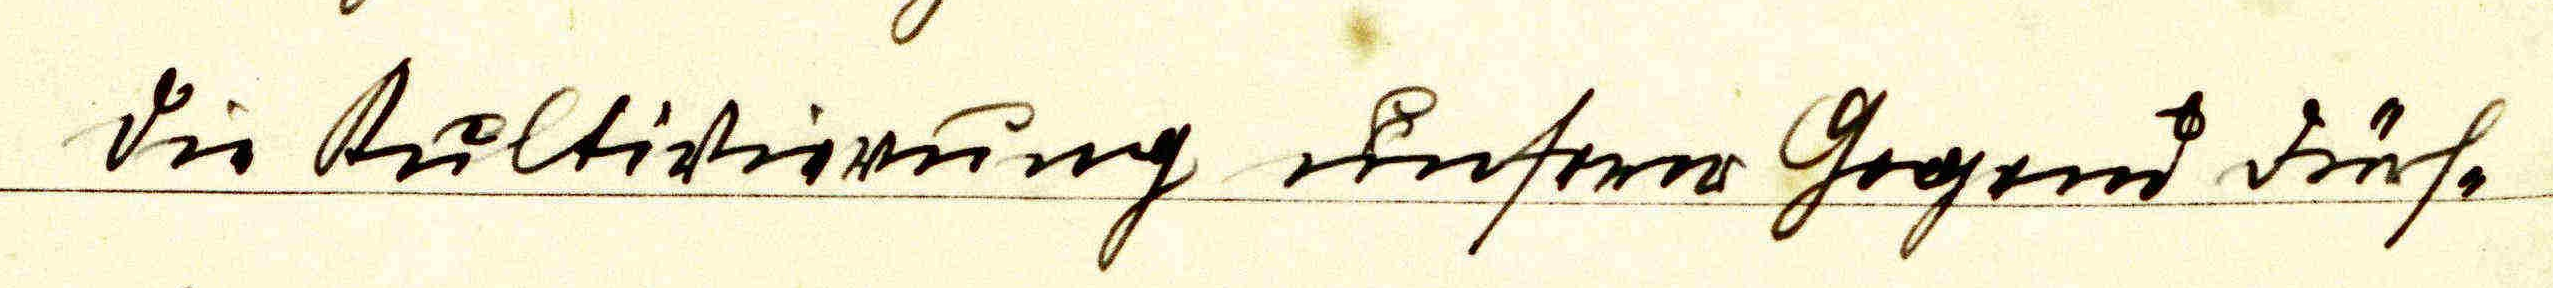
DIe Kultivierung unserer Gegend dürf-
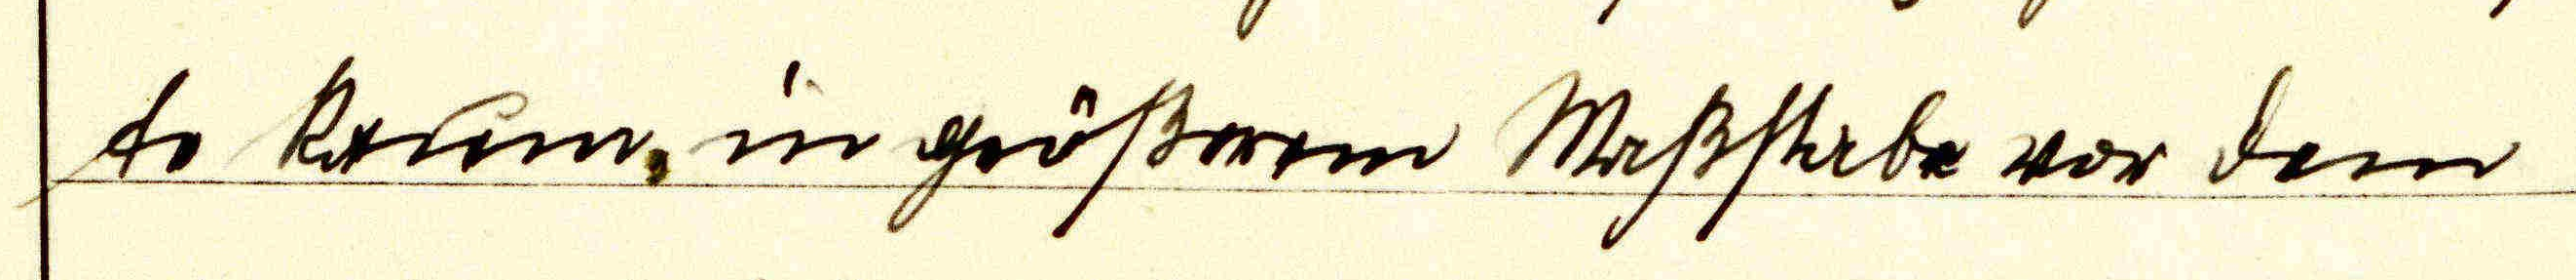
te kaum in größerem Maßstabe vor dem
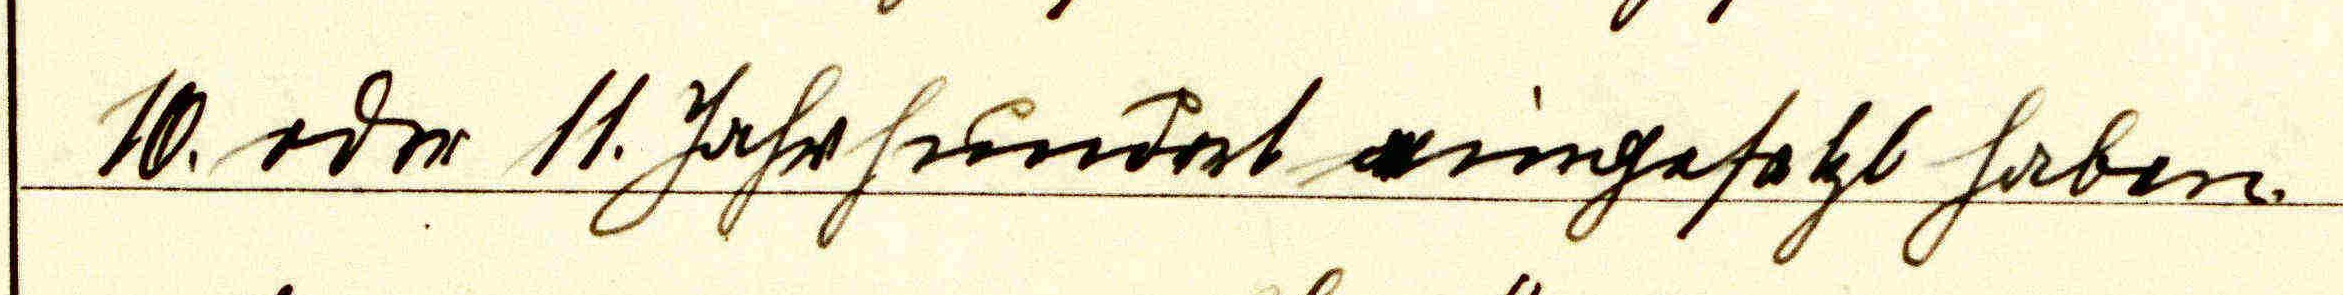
10. oder 11. Jahrhundert eingesetzt haben.
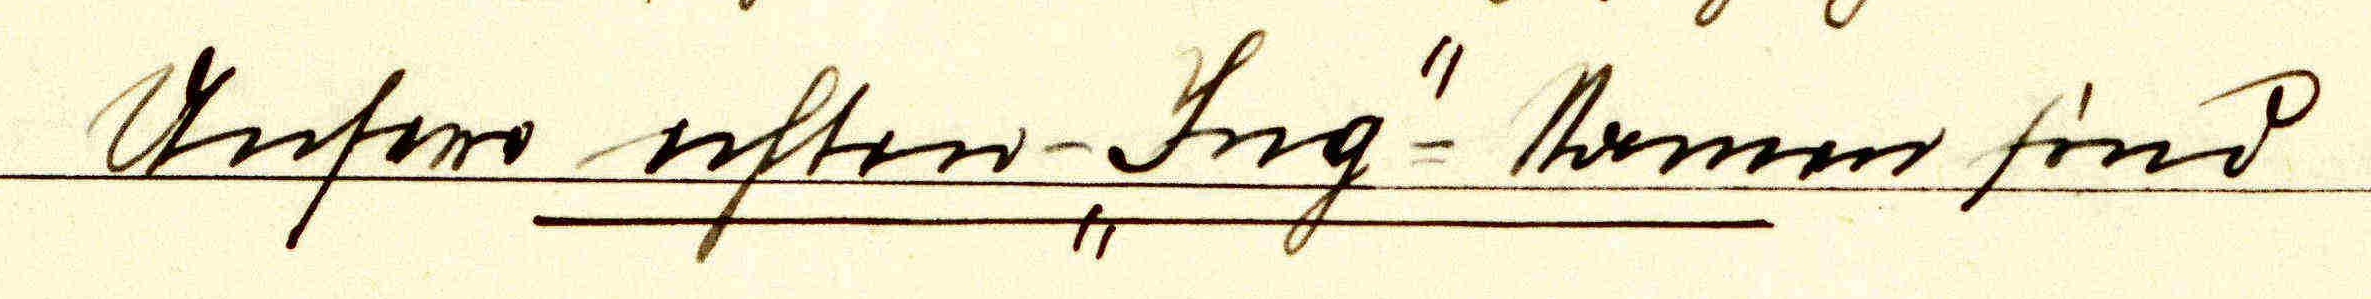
Unsere ersten "Ing"-Namen sind
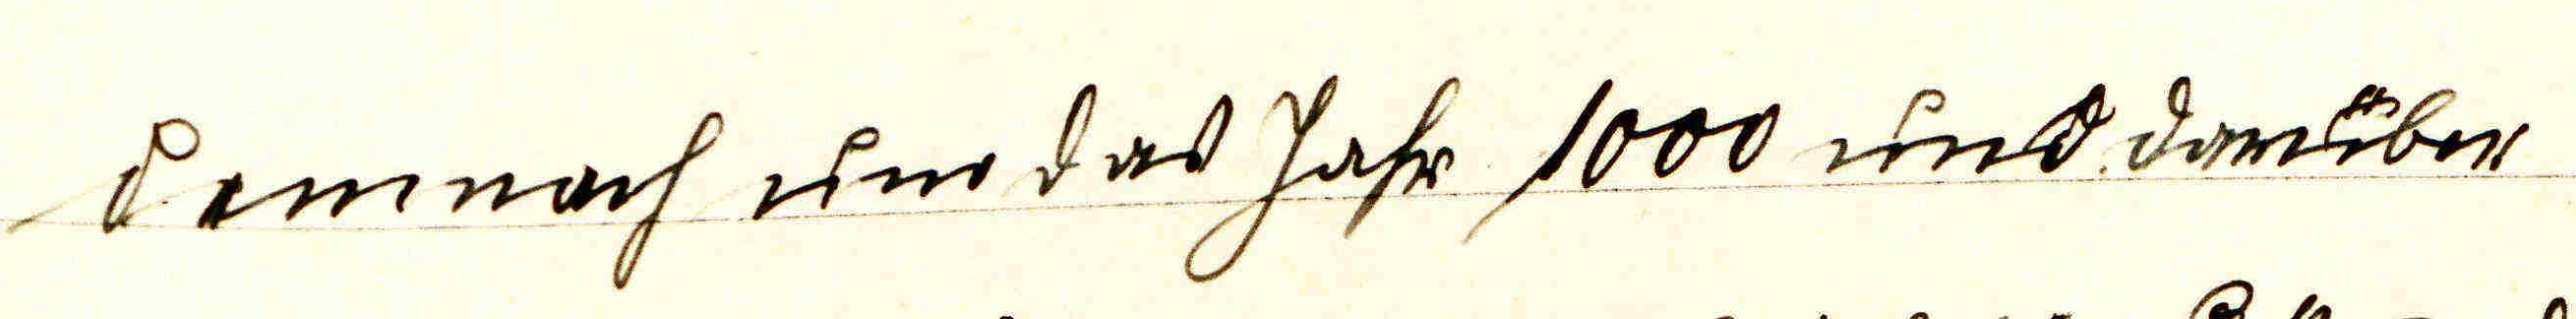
demnach um das Jahr 1000 und darüber
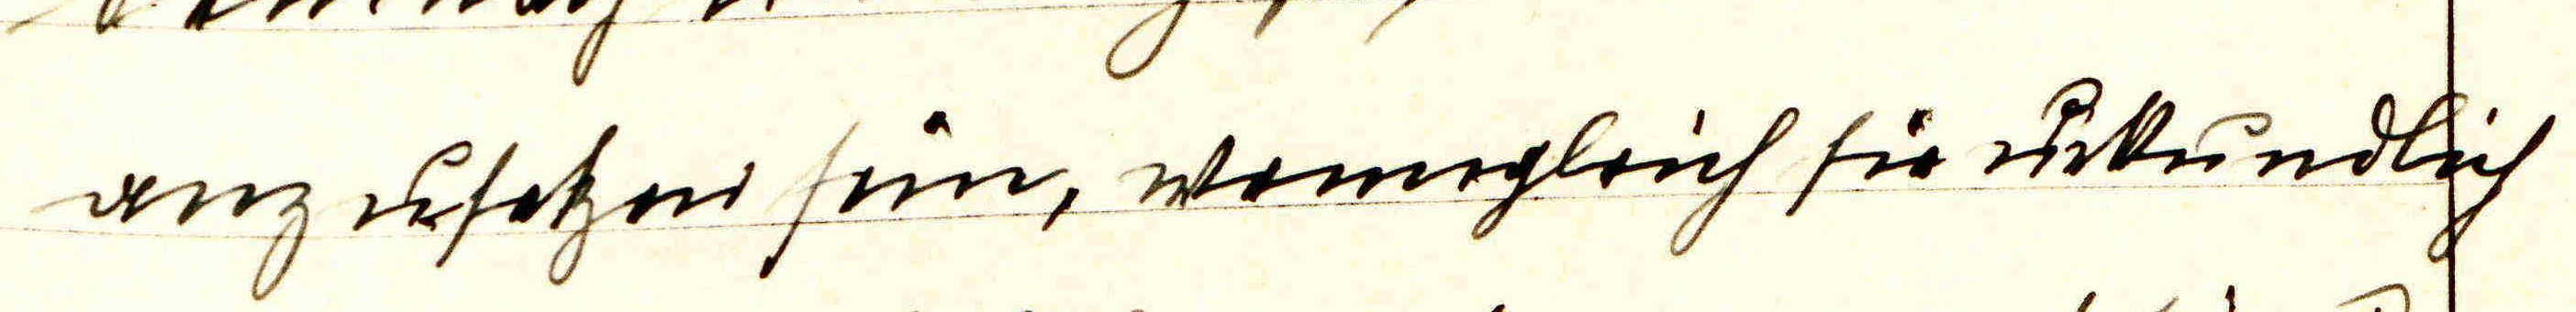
anzusetzen sein, wenngleich sie urkundlich
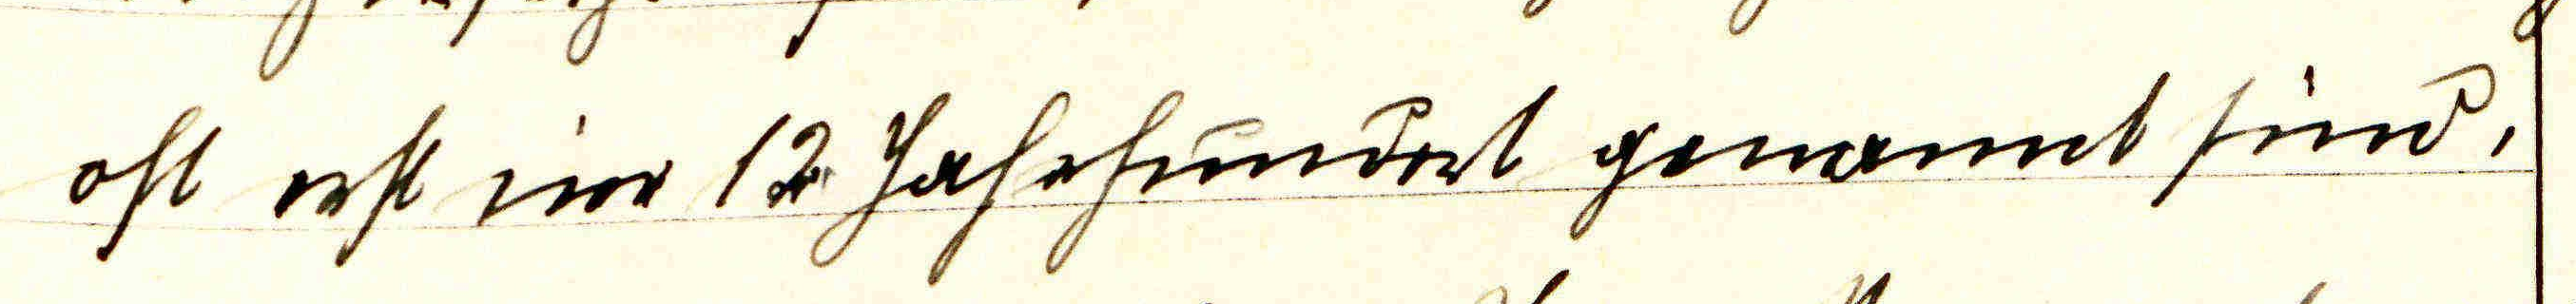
oft erst im 12 Jahrhundert genannt sind.
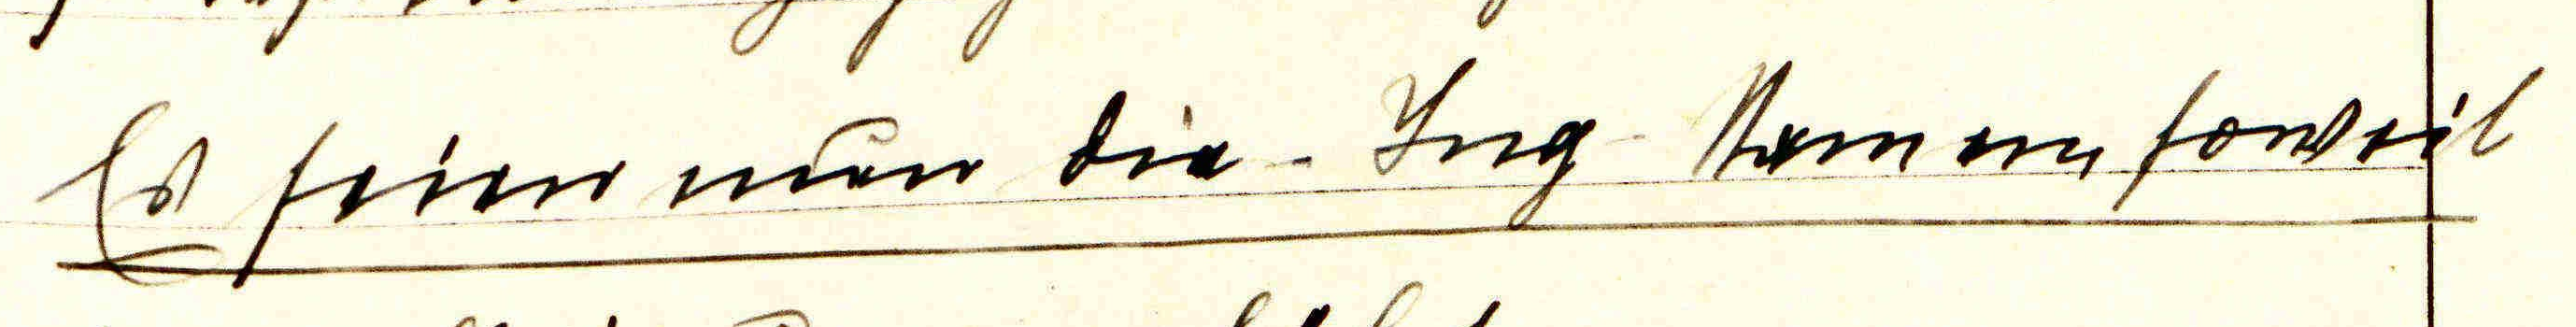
Es seien nun die Ing-Namen soweit
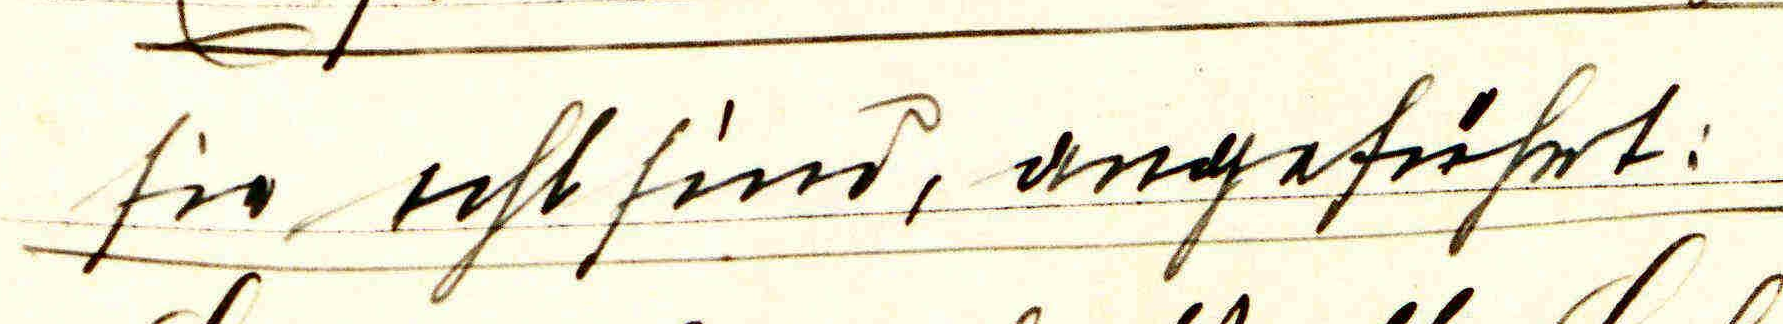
sie echt sind, angeführt:
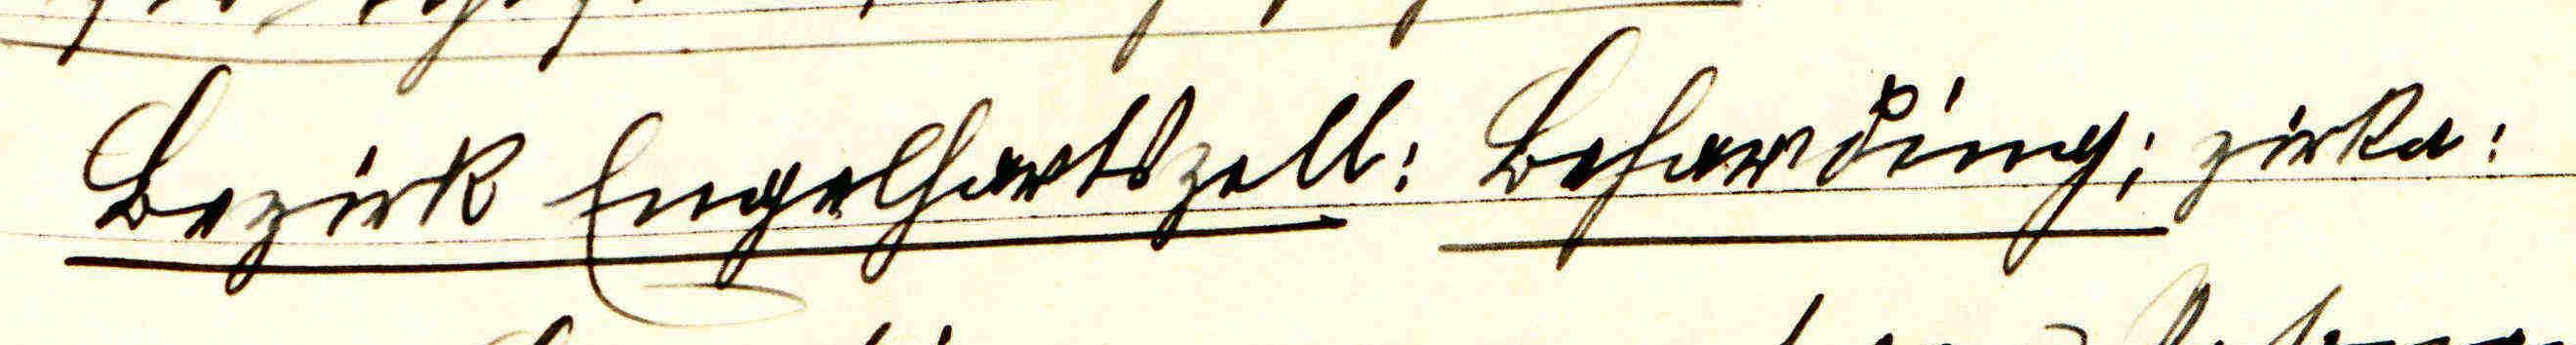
Bezirk Engelhartszell: Beharding; zirka
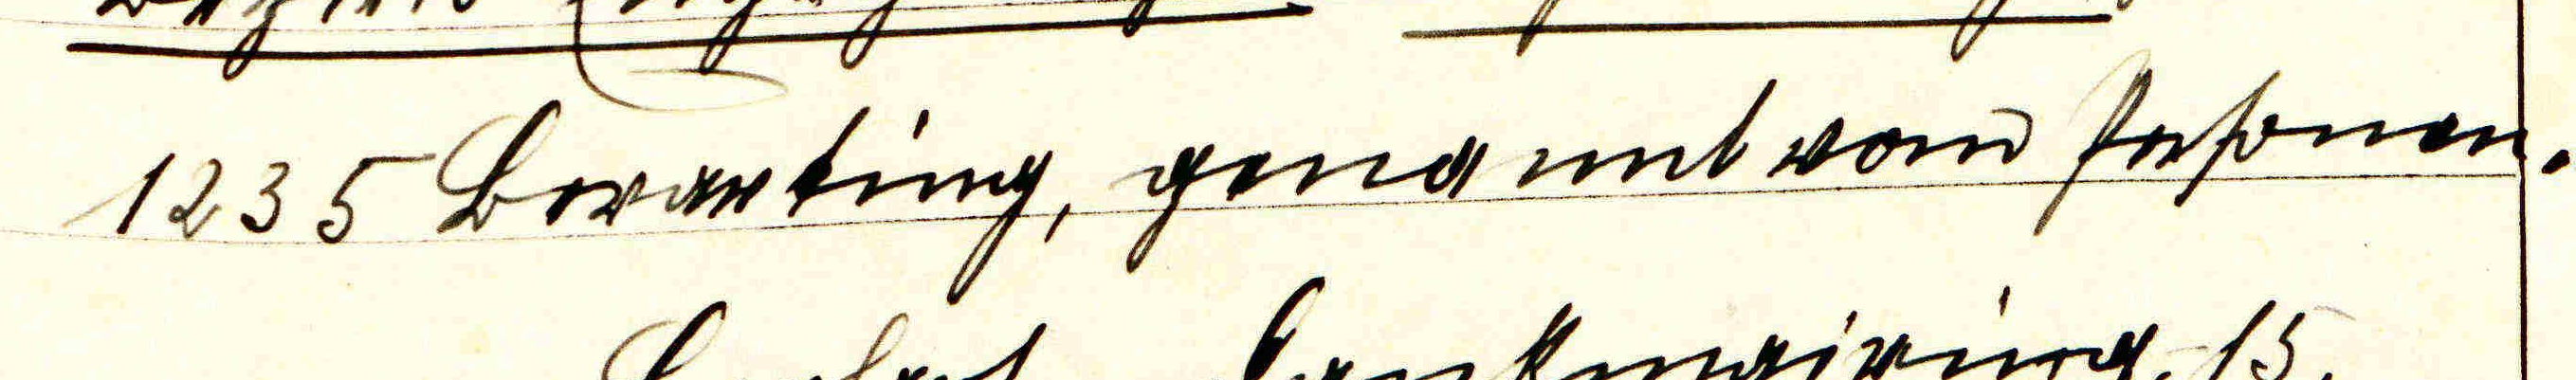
1235 Berarting, genannt von Personen-
